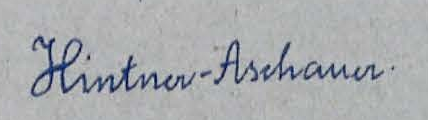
Hintner-Aschauer
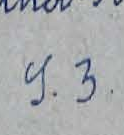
S. 3.
